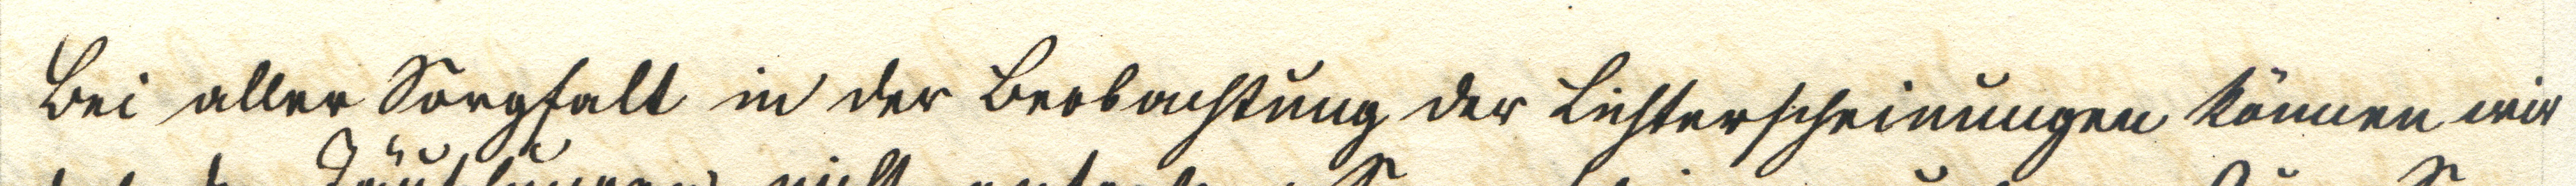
Bei aller Sorgfalt in der Beobachtung der Lichterscheinungen können wir
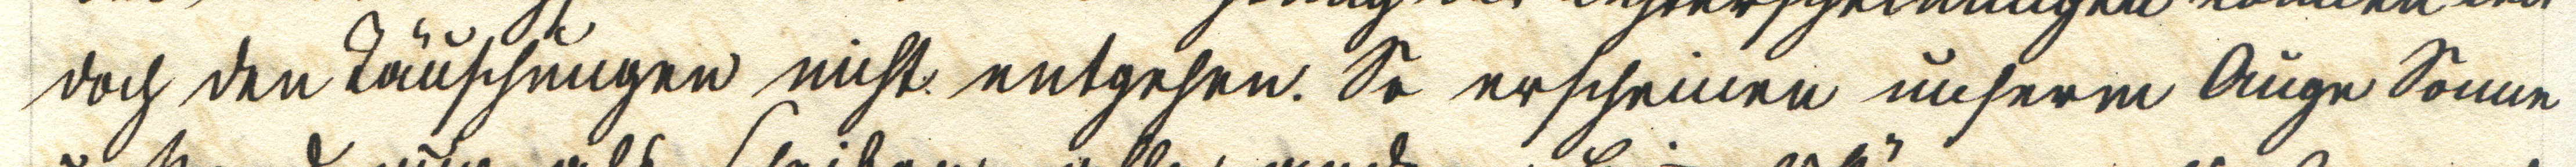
doch den Täuschungen nicht entgehen. So erscheinen unserm Auge Sonne
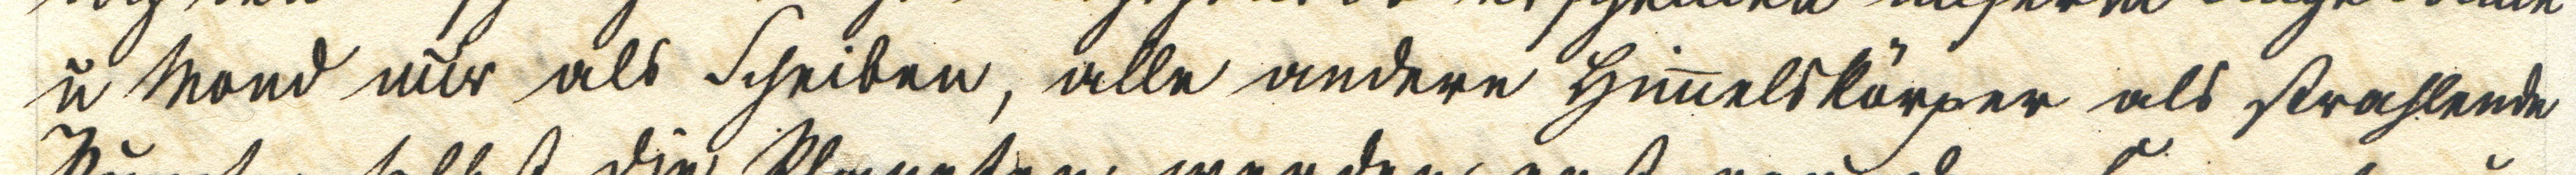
u Mond nur als Scheiben, alle andern Him̃elskörper als strahlende
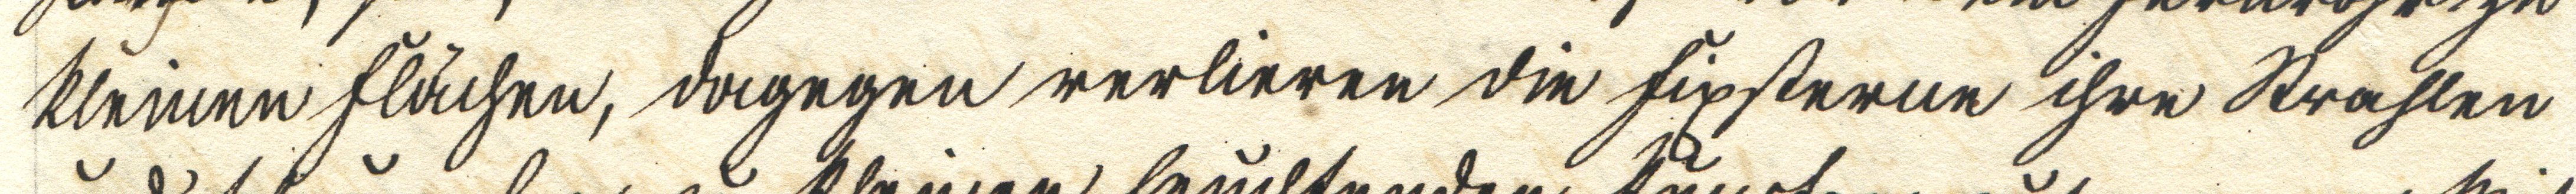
kleinen Flächen, dagegen verlieren die Fixsterne ihre Strahlen
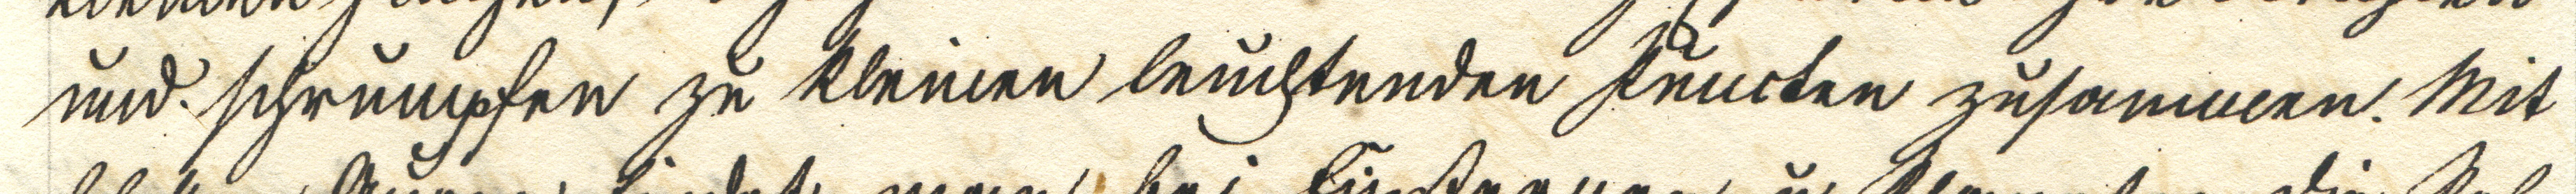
und schrumpfen zu kleinen leuchtenden Puncten zusammen. Mit
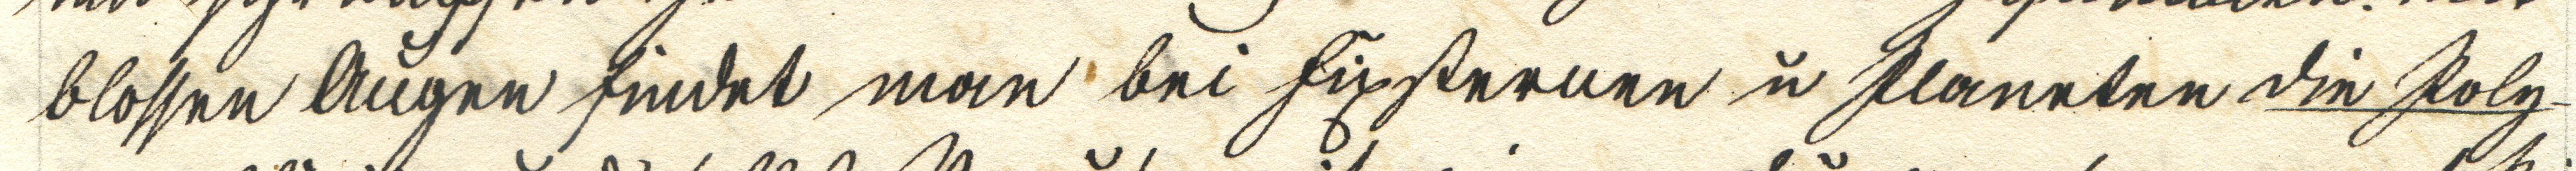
blossen Augen findet man bei Fixsternen u Planeten die Poly-
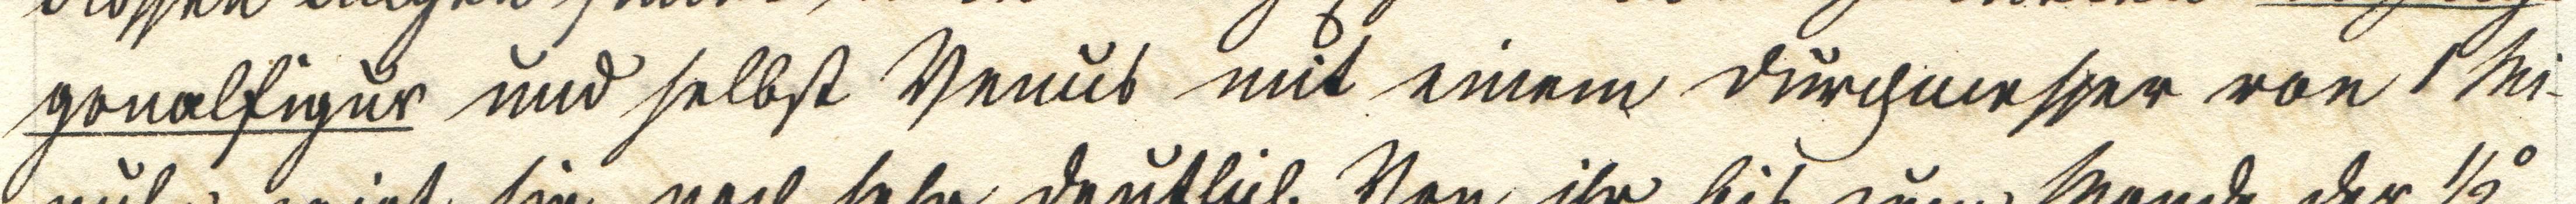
gonalfigur und selbst Venus mit einem Durchmesser von 1 Mi-
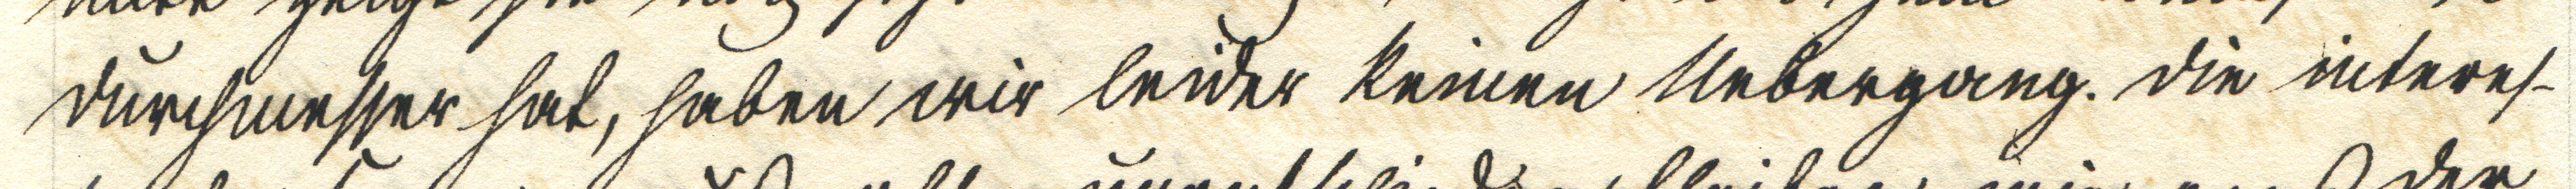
Durchmesser hat, haben wir leider keinen Uebergang. Die interes-
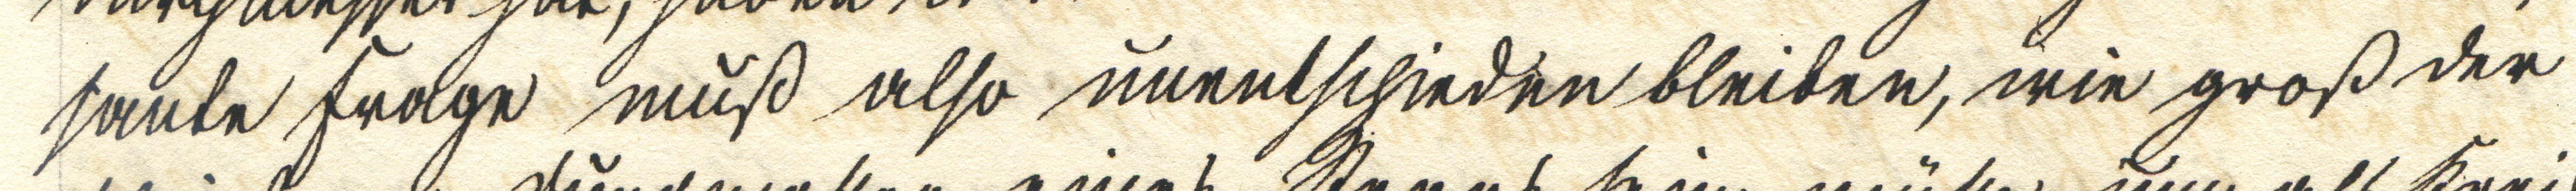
sante Frage muß also unentschieden bleiben, wie groß der
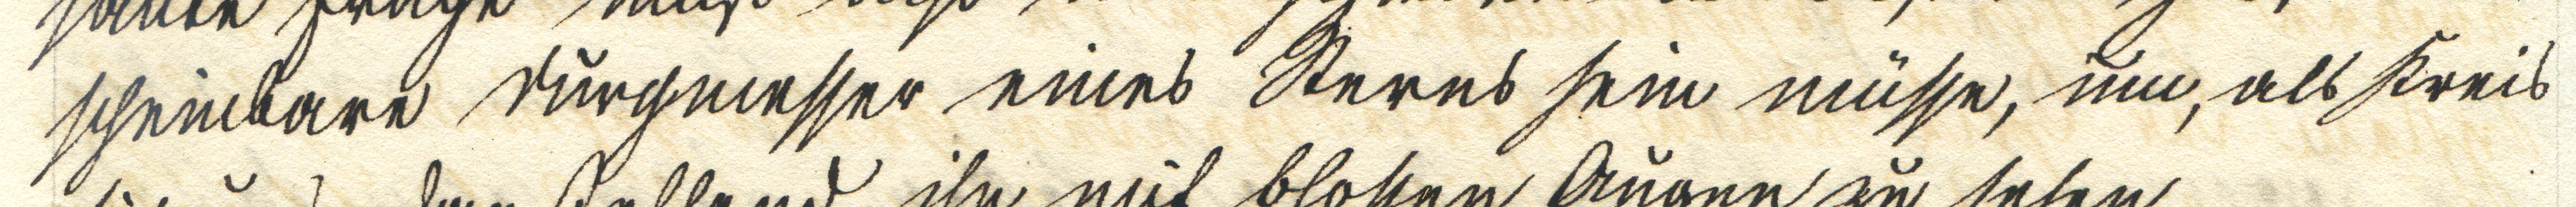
scheinbare Durchmesser eines Sterns sein müsse, um, als Kreis
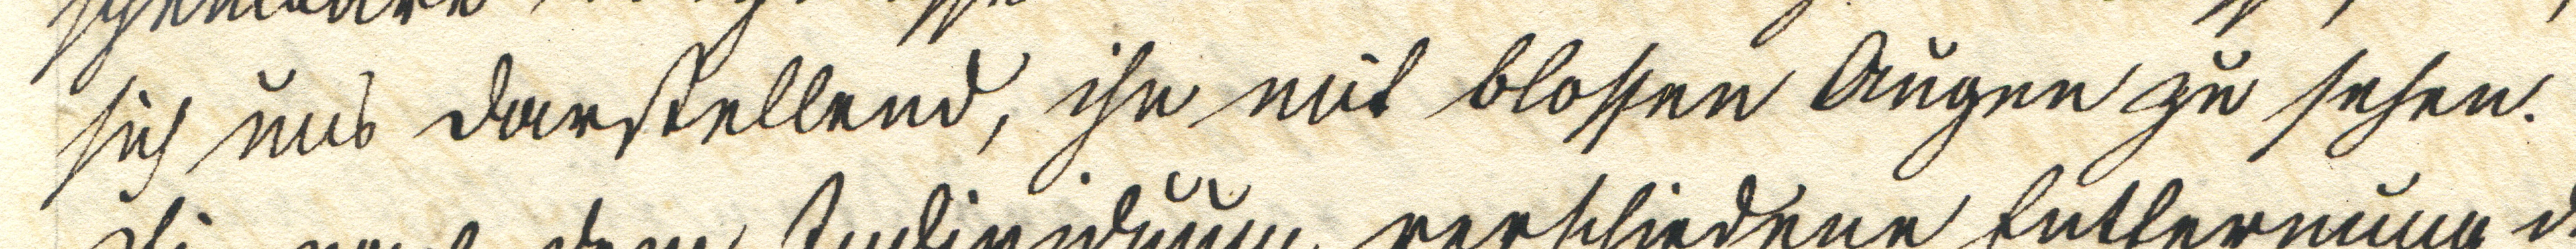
sich uns darstellend, ihn mit blossen Augen zu sehen.
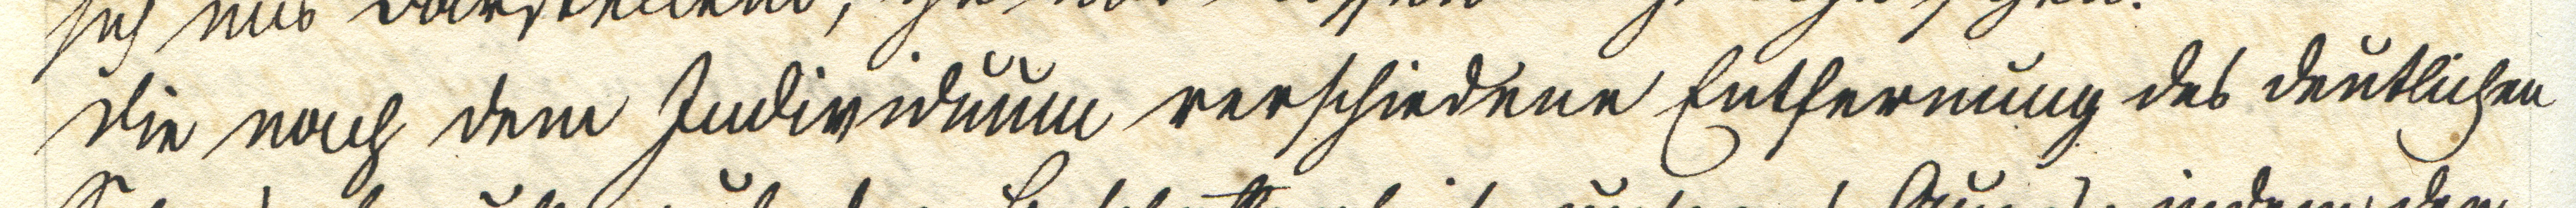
Die nach dem Individuum verschiedene Entfernung des deutlichen
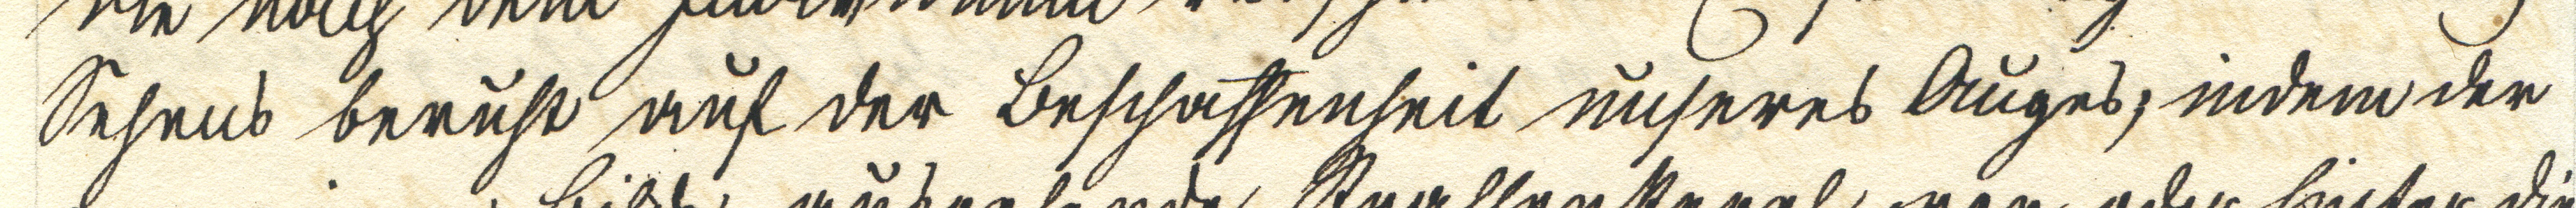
Sehens beruht auf der Beschaffenheit unseres Auges, indem der
